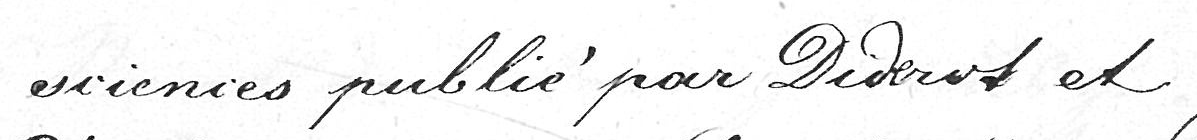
sciences publié par Diderot et
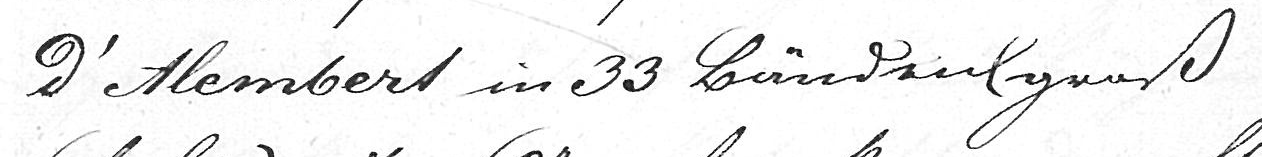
d'Alembert in 33 Bänden (groß
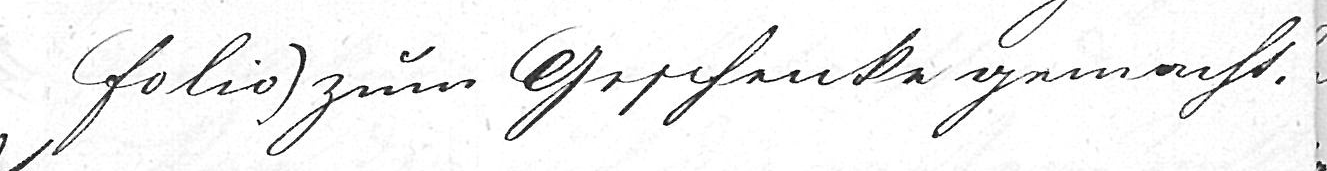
folio) zum Geschenke gemacht.
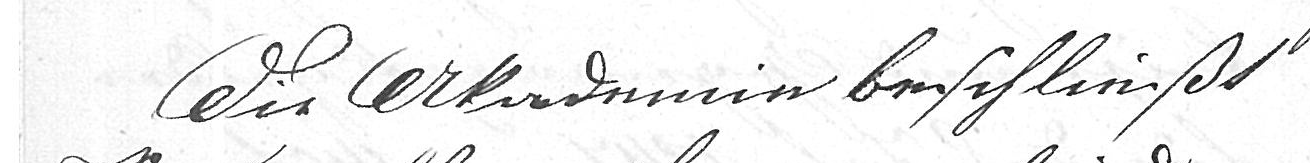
Die Akademie beschließt
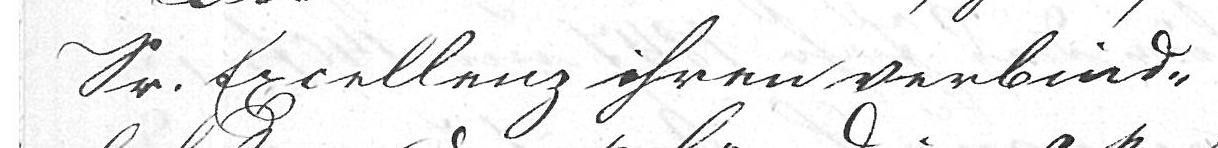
Sr. Excellenz ihren verbind-
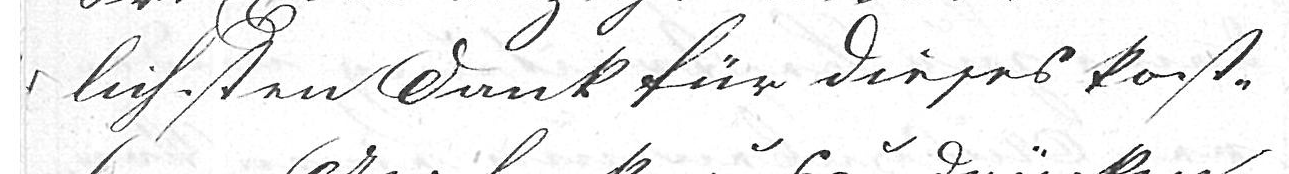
lichsten Dank für dieses kost-
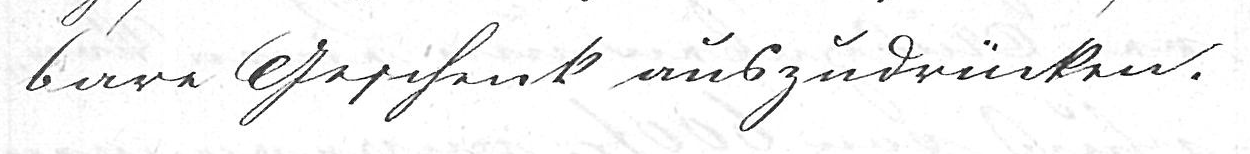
bare Geschenk auszudrücken.
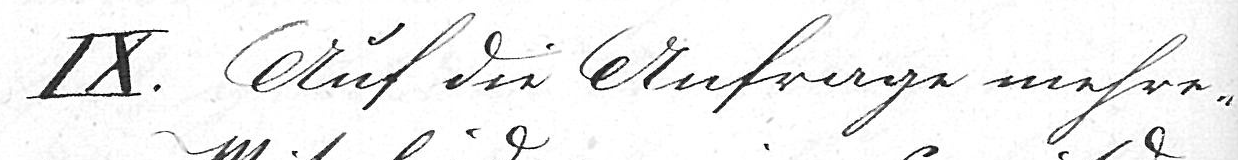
IX. Auf die Anfrage mehre-
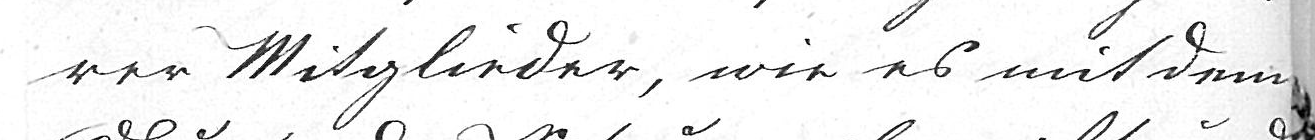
rer Mitglieder, wie es mit dem
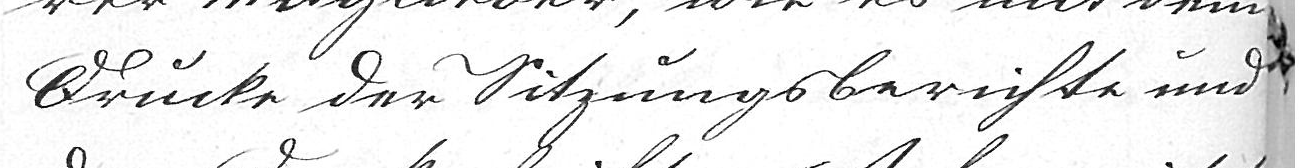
Drucke der Sitzungsberichte und
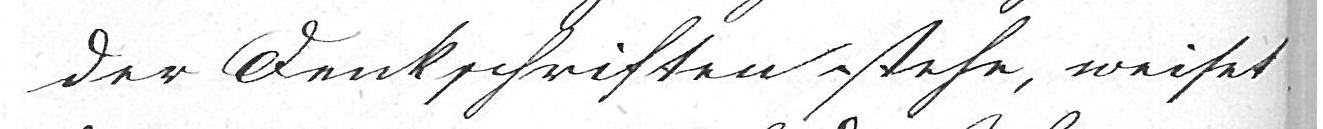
der Denkschriften stehe, weiset
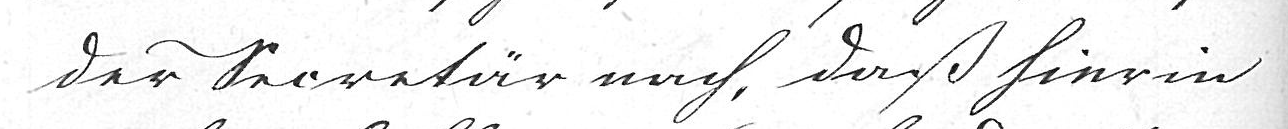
der Secretär nach, daß hierin
